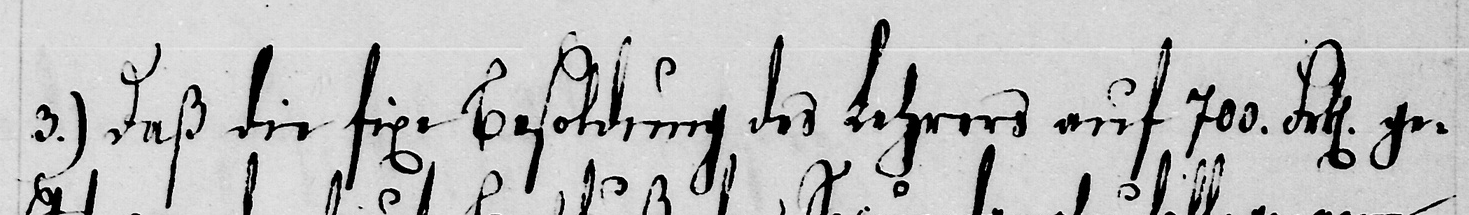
3.) Daß die fixe Besoldung des Lehrers auf 700. Frk[en].
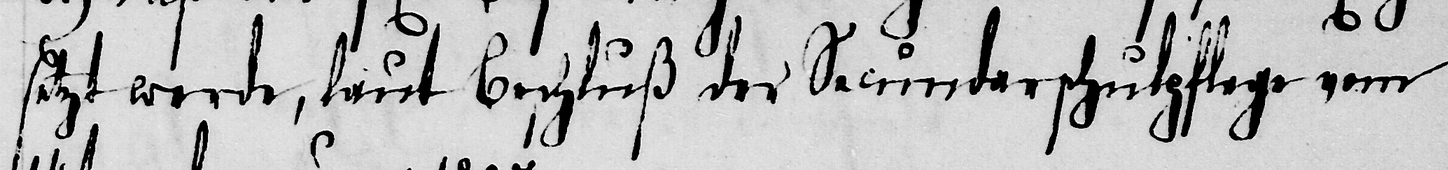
setzt werde, laut Beschluß der Secundarschulpflege vom
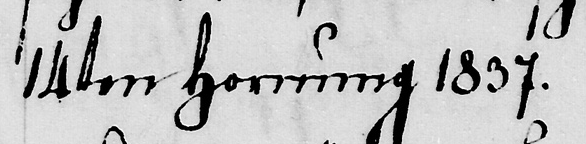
14ten Hornung 1837.
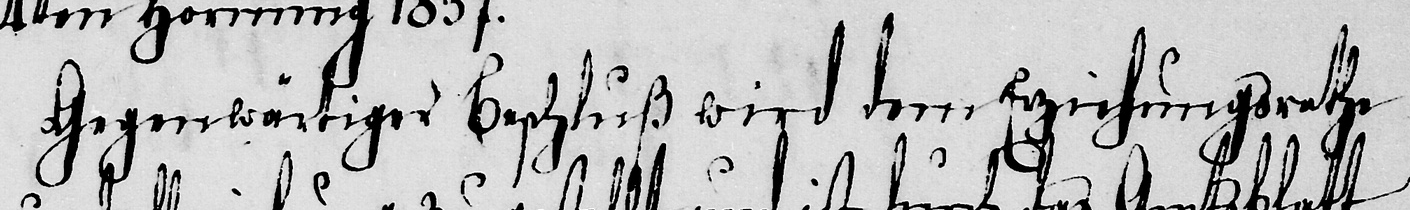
Gegenwärtiger Beschluß wird dem Erziehungsrathe
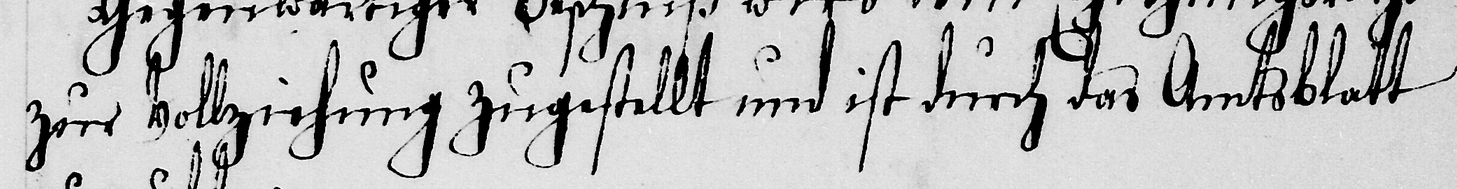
zur Vollziehung zugestellt und ist durch das Amtsblatt
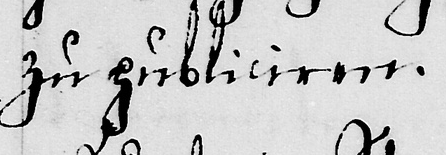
zu publiciren.
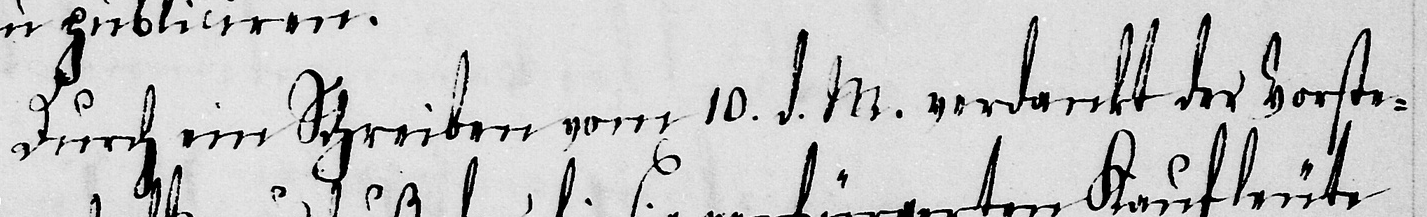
Durch ein Schreiben vom 10. d. M. verdankt der Vorste¬
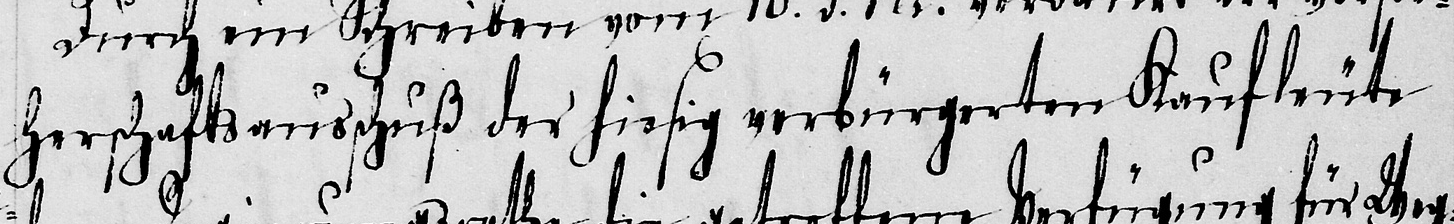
herschaftsausschuß der hiesig verbürgerten Kaufleute
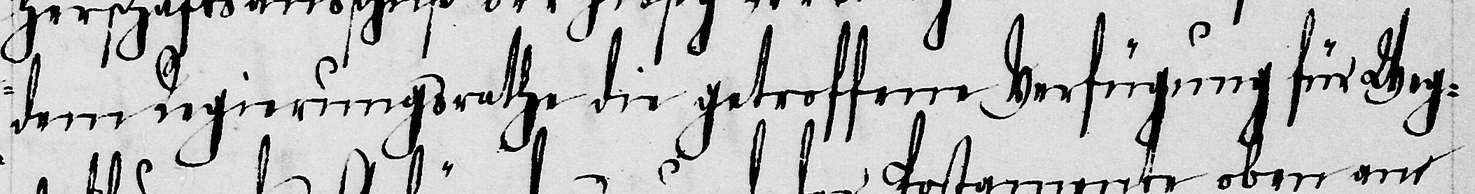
dem Regierungsrath die getroffene Verfügung für Wegs¬
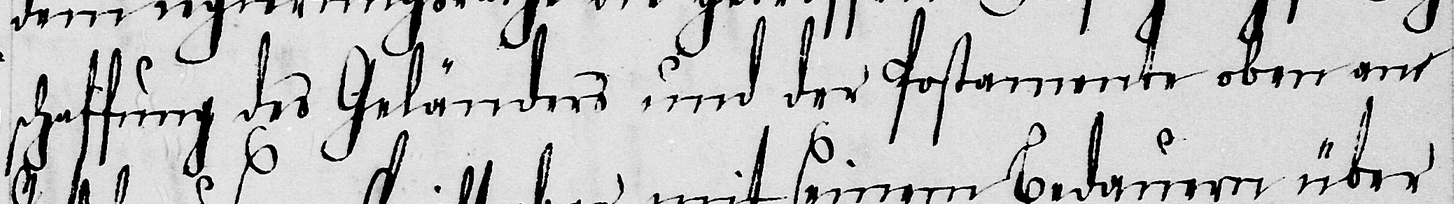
chaffung des Geländers und der Postamente oben am
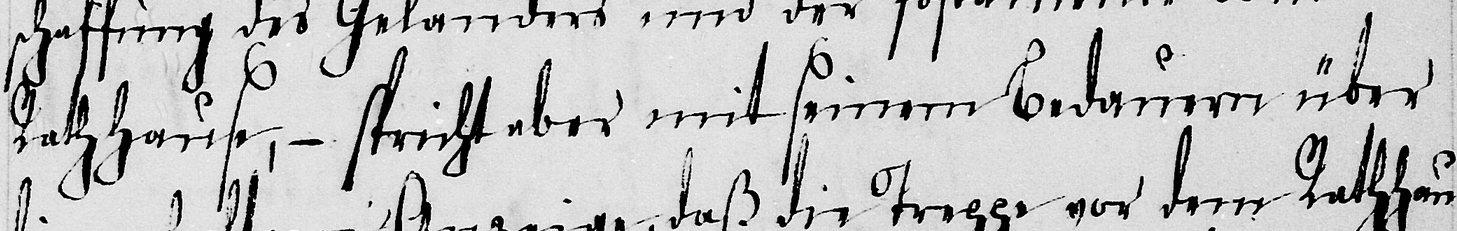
Rathhause,– spricht aber mit seinem Bedauern über
